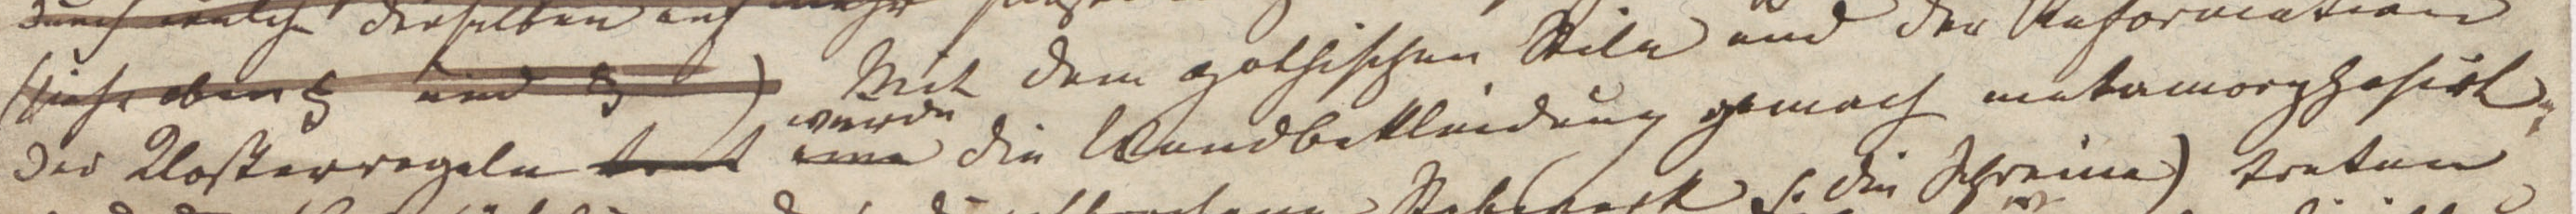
der Klosterregeln trat eine wurde die Wandbekleidung gemach metamorphosirt;
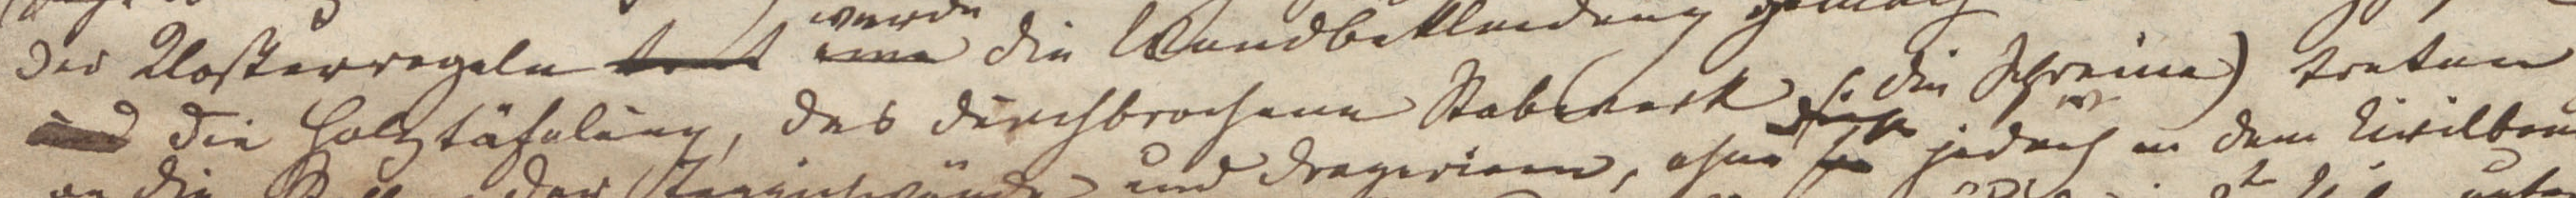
und die Holztäfelung, das durchbrochene Stabwerk s. die Schreine) treten
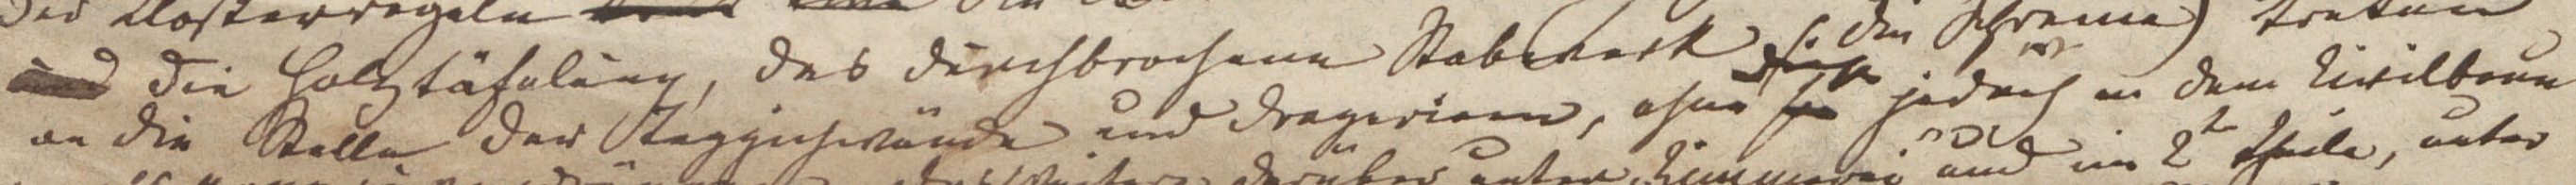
an die Stelle der Teppichwände und Draperieen, ohne sie diese jedoch in dem Civilbaue
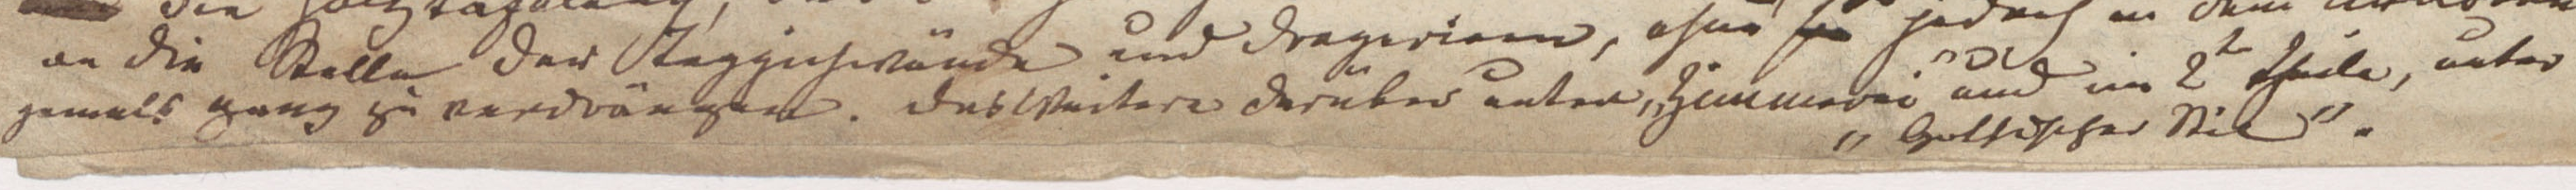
jemals ganz zu verdrängen. Das Weitere darüber unter "Zimmerei" und im 2t Theile, unter
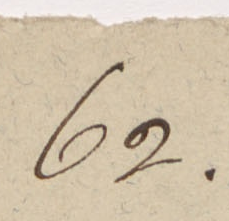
62.
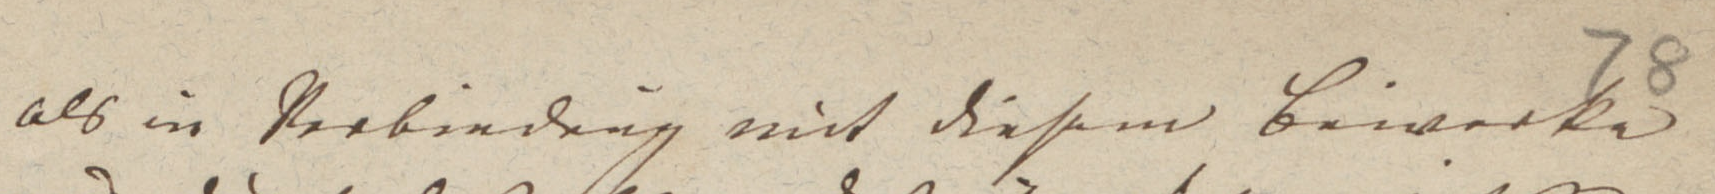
als in Verbindung mit diesem Beiwerke
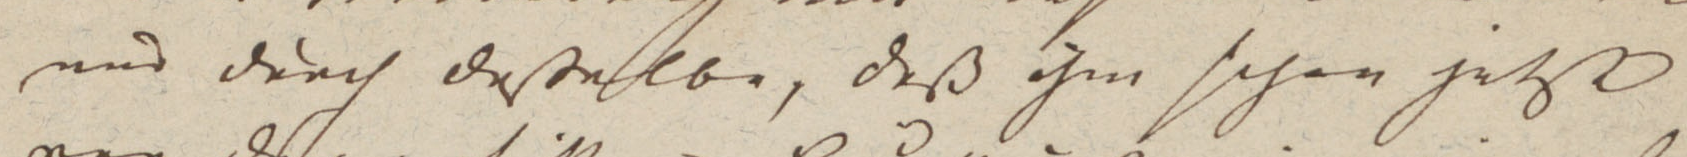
und durch dasselbe, dass ihm schon jetzt
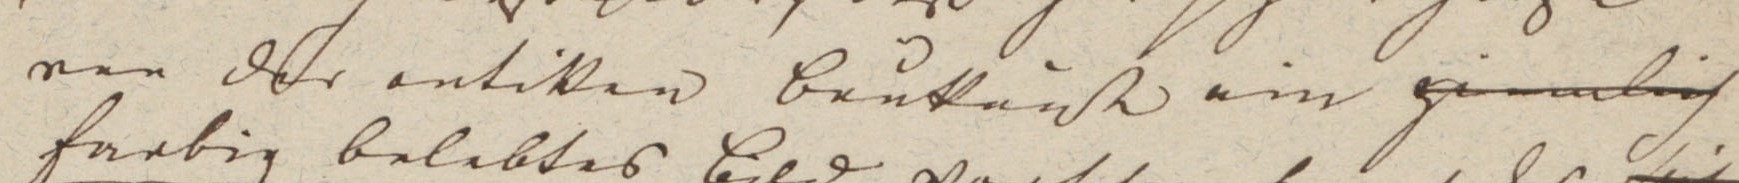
von der antiken Baukunst ein ziemlich
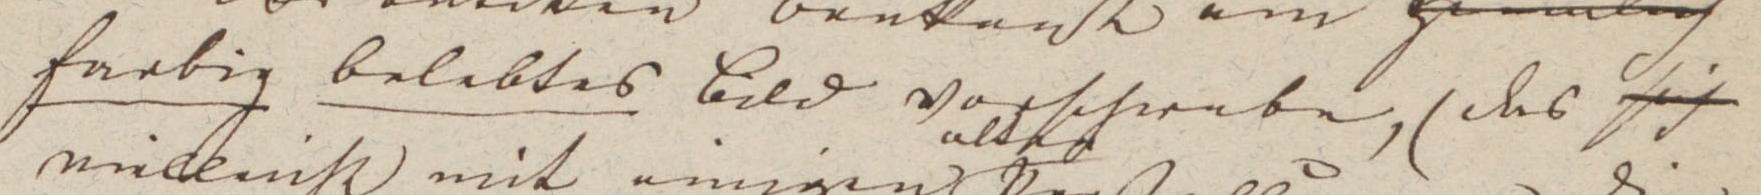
farbig belebtes Bild vorschwebe, (das sich
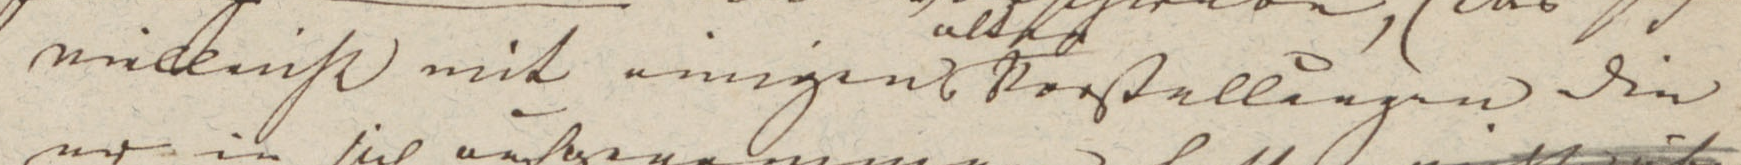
vielleicht mit einigen alten Vorstellungen die
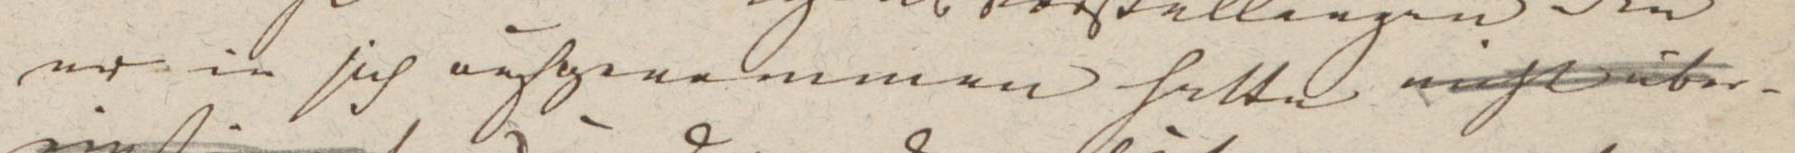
er in sich aufgenommen hatte nicht über-
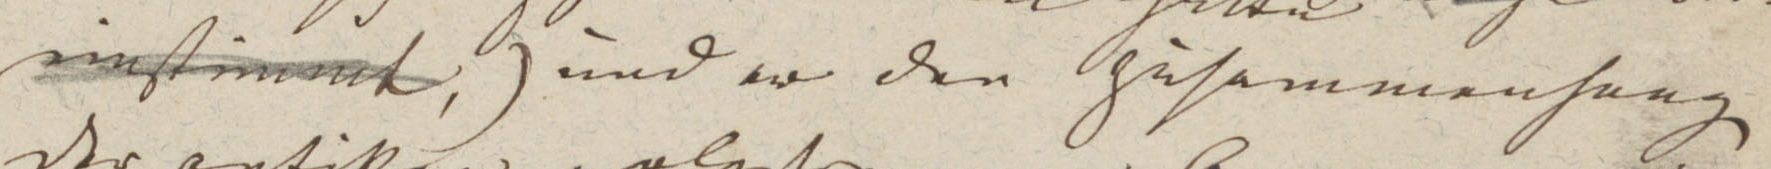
einstimmt,) und er den Zusammenhang
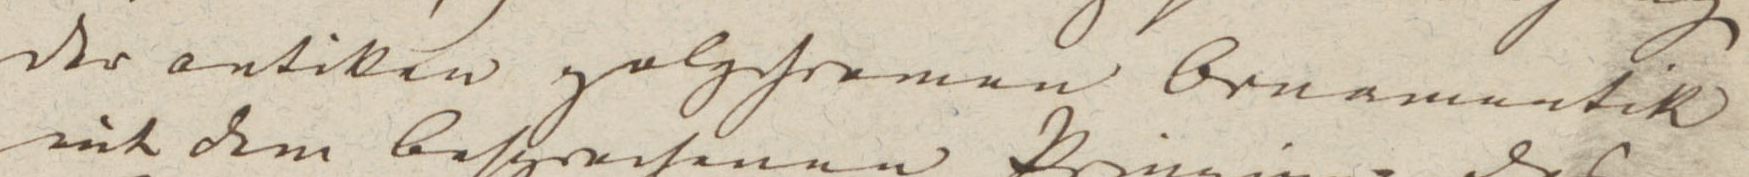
der antiken polychromen Ornamentik
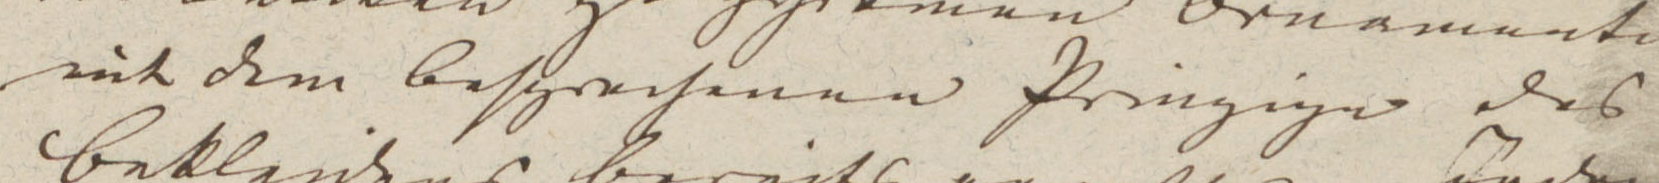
mit dem besprochenen Prinzipe des
